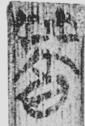○（孰）
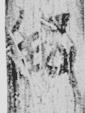○（賢）
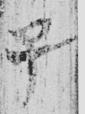子
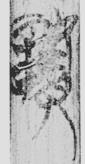贛（貢）
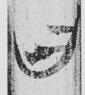曰
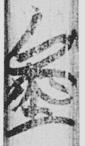○（舜）
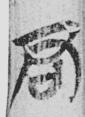君
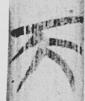天
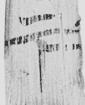下
